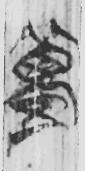{𦭝五}
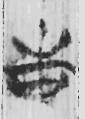告
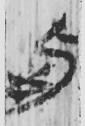此
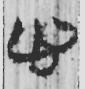心
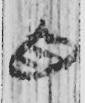目
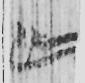亡
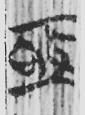亟
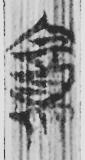{富示}
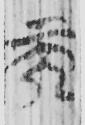而
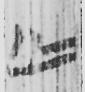亡
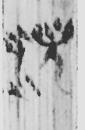淣
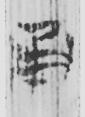用
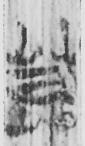莫
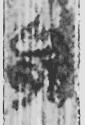能
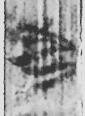{之止}
